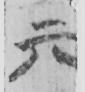亓
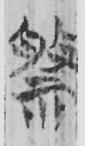祭
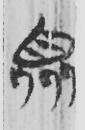眾
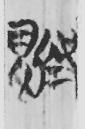{於鳥}（烏）
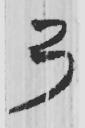乃
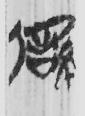{人言糸}
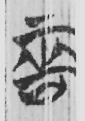{巫口}
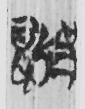{於鳥}（烏）
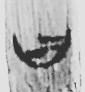曰
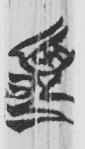{日止頁}（夏）
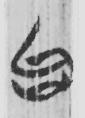句
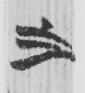之
